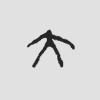大
